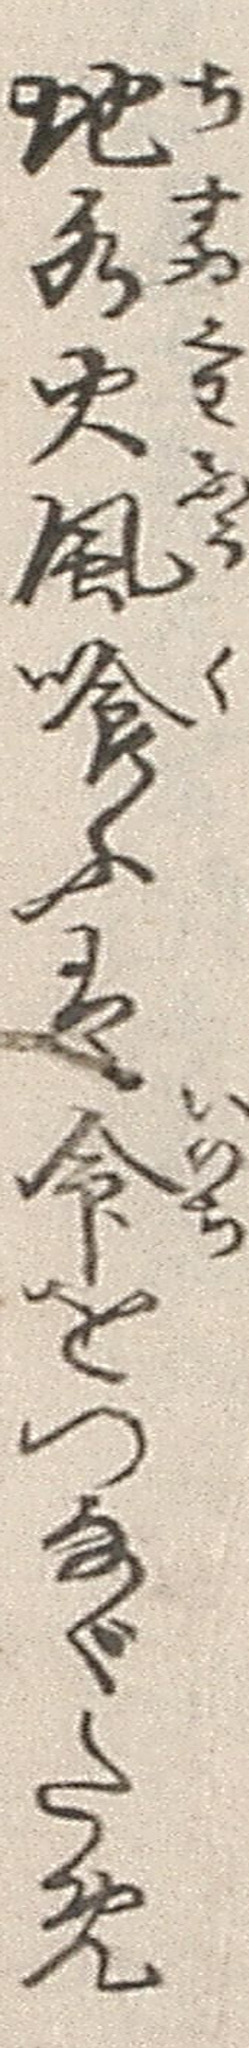地水火風喰ふは命をつなぐため
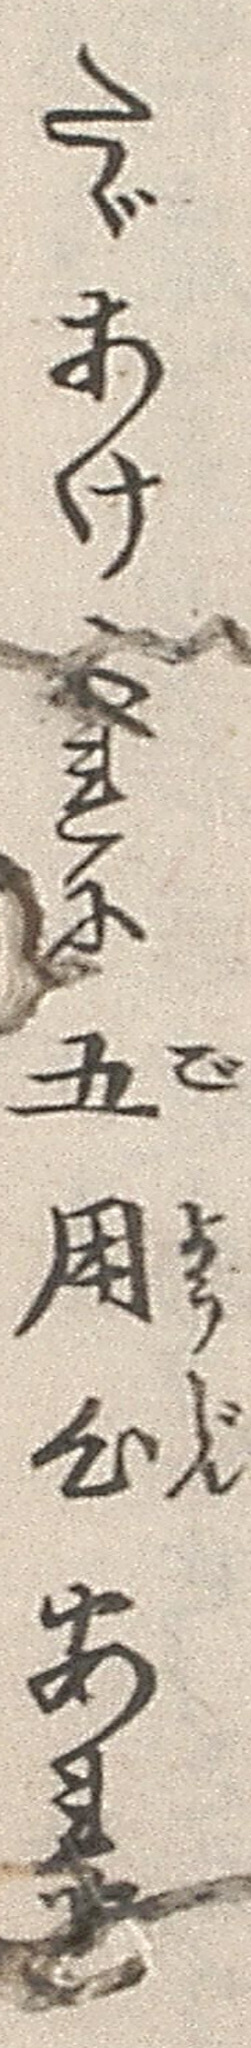たゞあけくれに五用心あれと
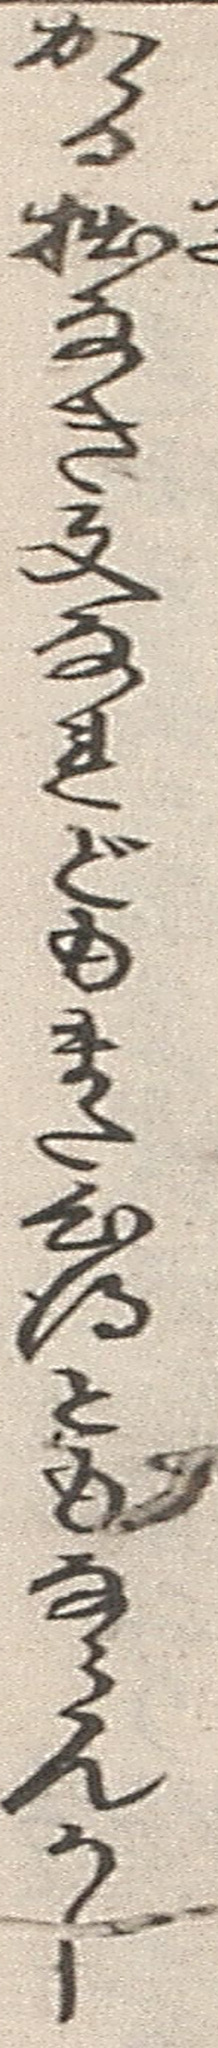かゝる拙なき文なれどもまた心得ともならんかし
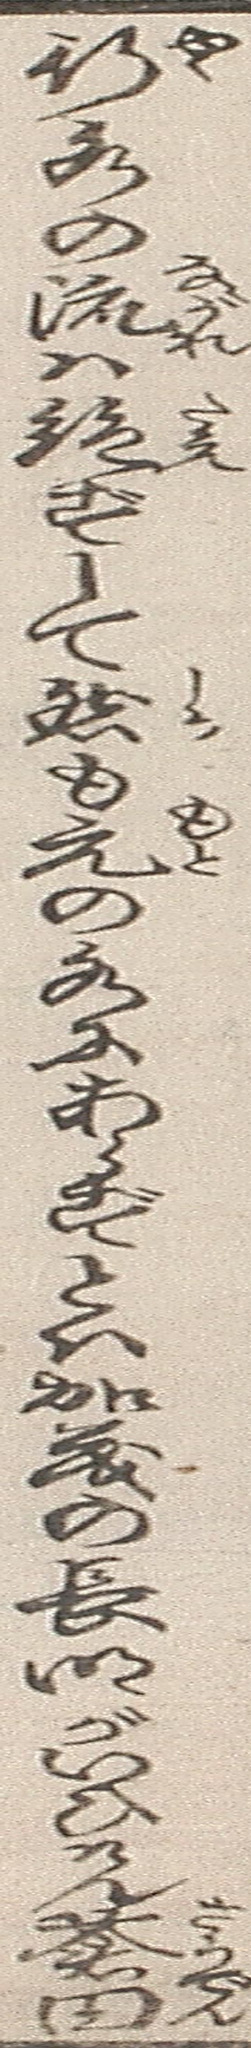行水の流ハ絶ずして然も元の水にあらずとハ加茂の長明がいひけん蒼田
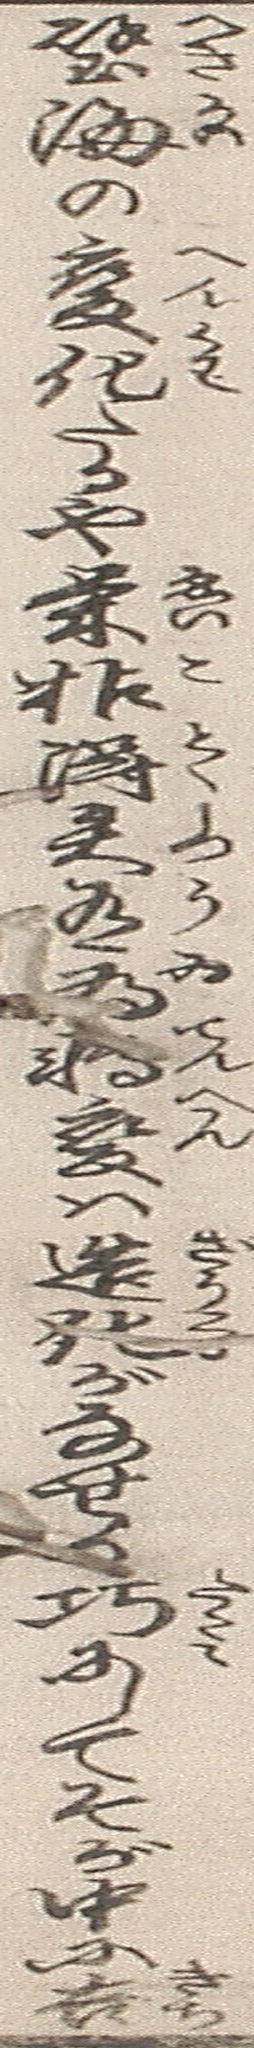璧海の変化たるや栄枯得失有為転変ハ造化がなせる巧にてそが中に吉
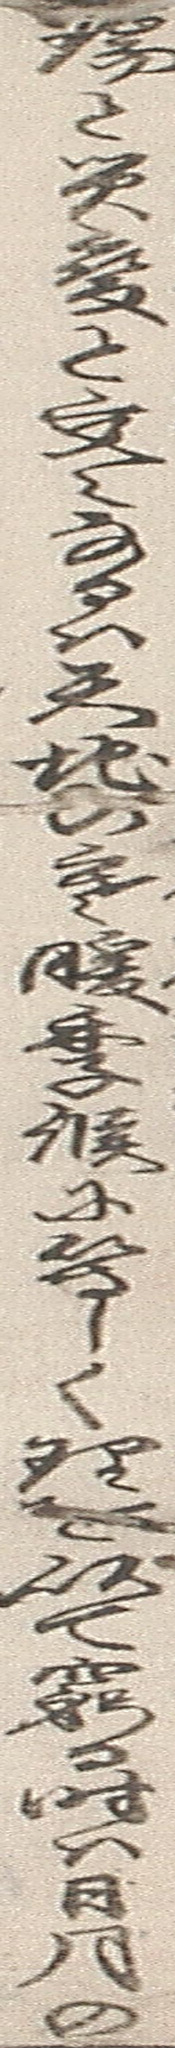瑞と災変と交々なるハ天地の寒暖季候に等しく理を以て窮る時ハ日月の
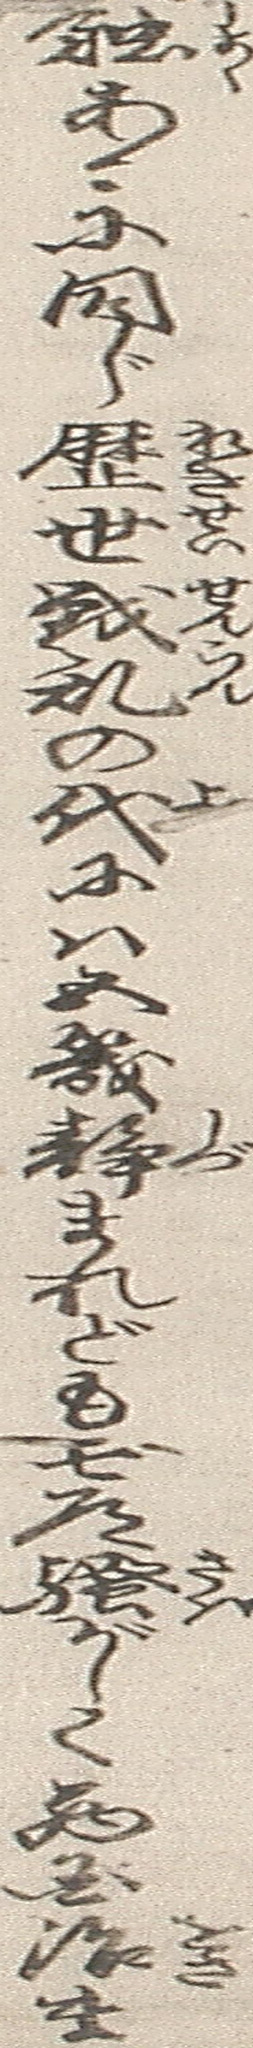蝕あるに同じ歴世戦乱の代には五畿静まれども七道騒がしく西国治ま
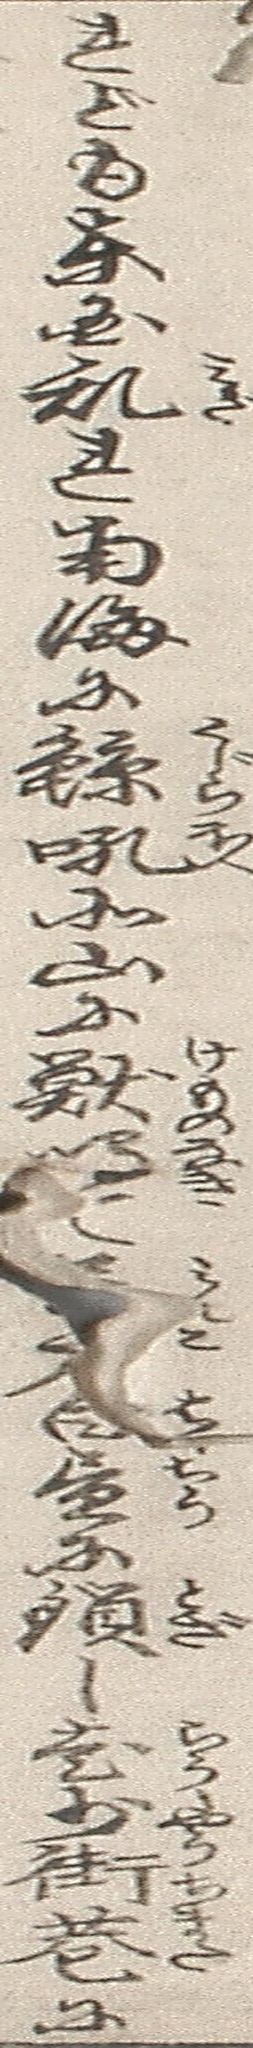れども東国乱れ南海に鯨吼北山に獣鳴て民戸白昼に鎖し老少街巷に
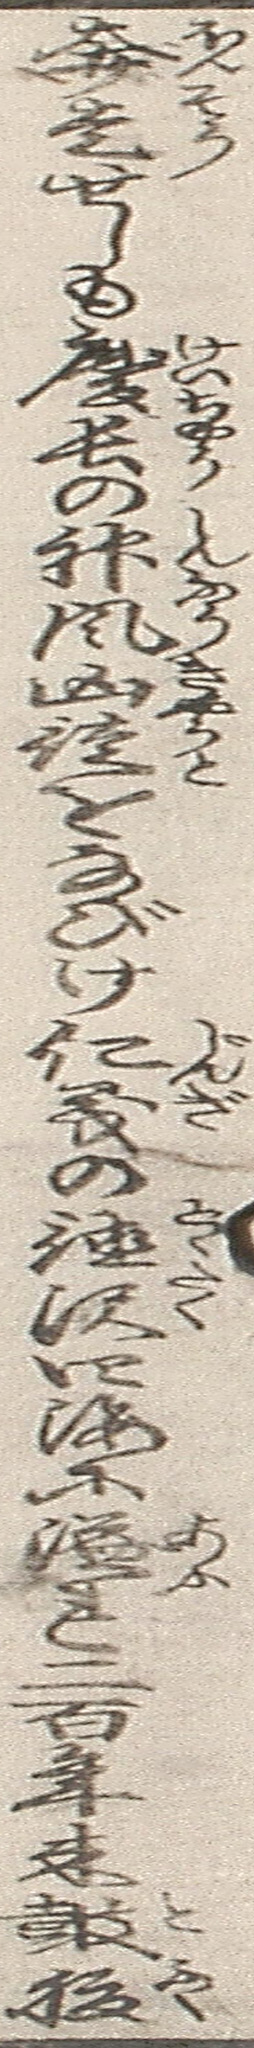奔走せしも慶長の神風兇徒をなびけ仁義の徳沢四海に溢れ二百年來鼓腹
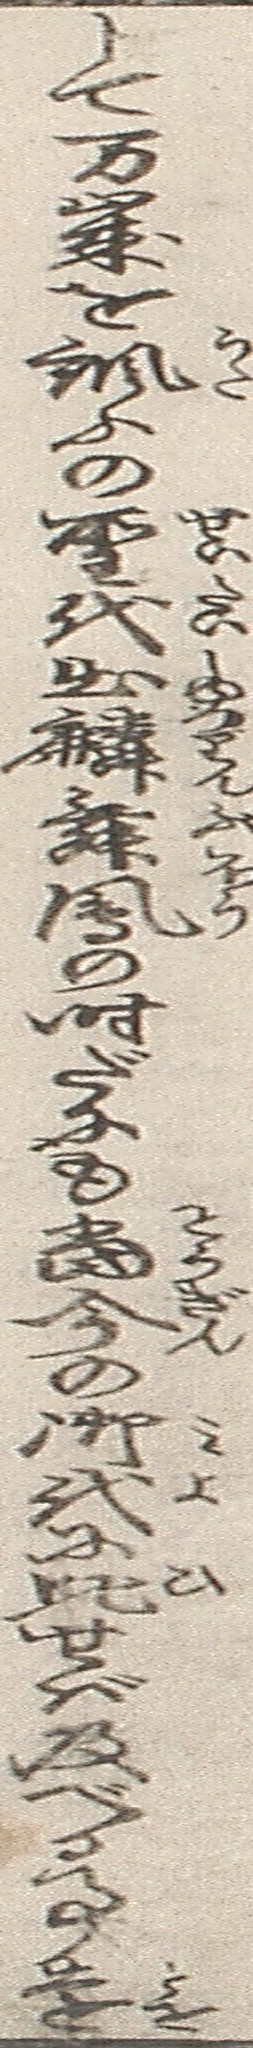して万歳を諷ふの聖代出麟舞鳳の時だにも当今の御代に比せバ及べる事遠
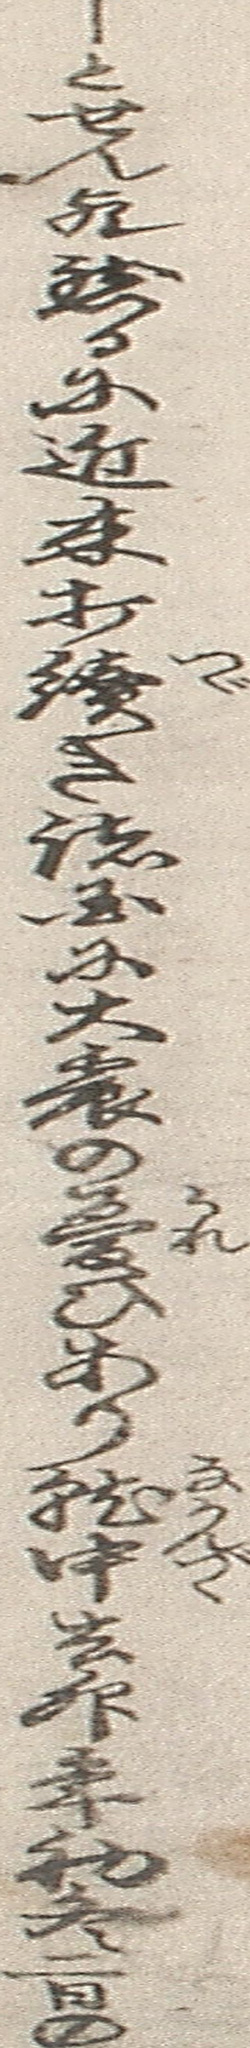しとせん歟然るに近来打続き諸国に大震の憂ひあり就中去卯年初冬二日の
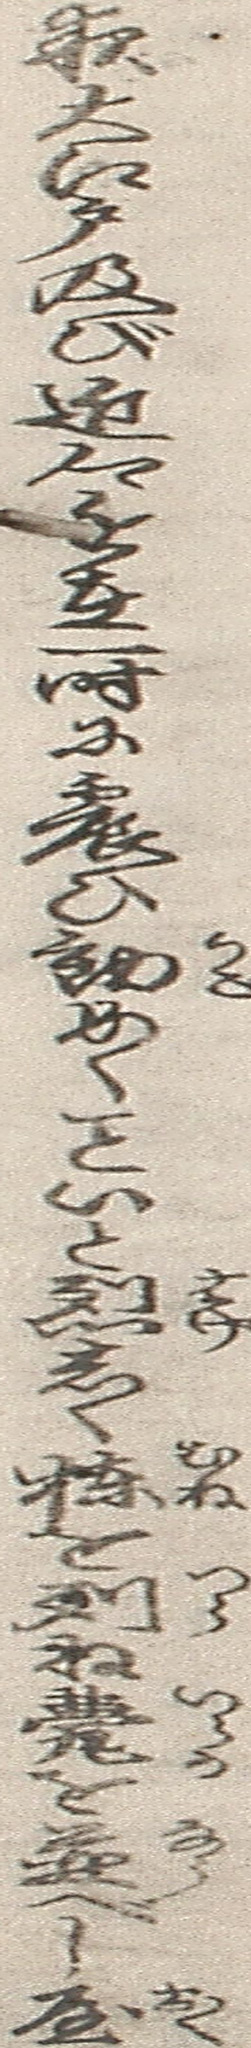夜大江戸及び近郷近在一時に震ひ動めくこといと烈しく棟を列ね甍を並べし屋
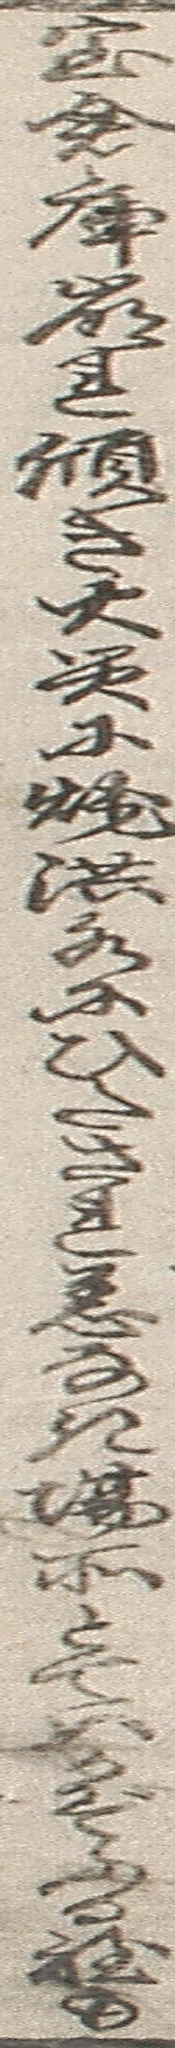室倉庫崩れ傾き火災に焼洪水にひたされ恙なき場所とてハかぞふる程も
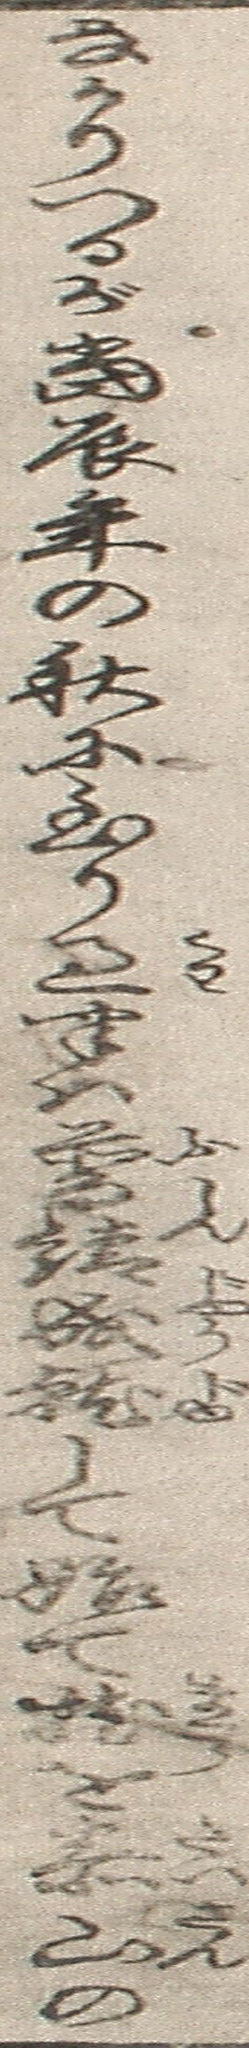なかりつるが当辰年の秋に至り過半ハ普請成就して始て枕を泰山の

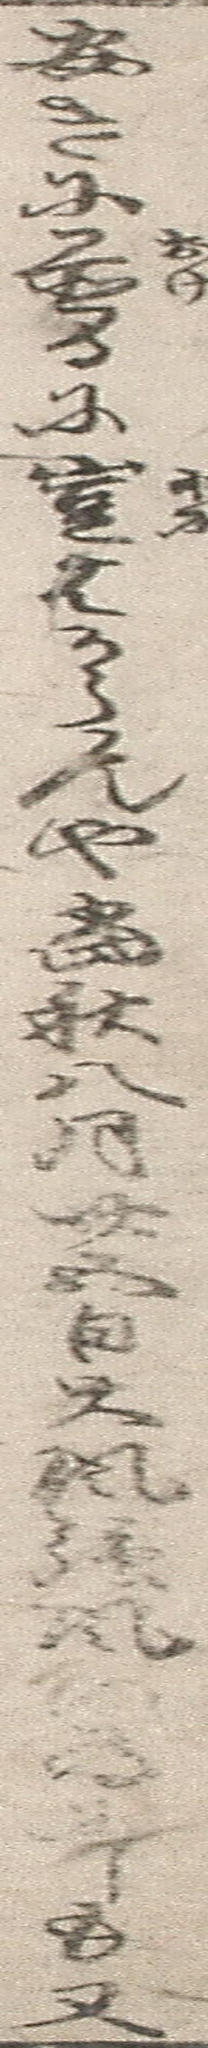安きに置るに豈はからんや当秋八月廿五日大風強風の為にしも又
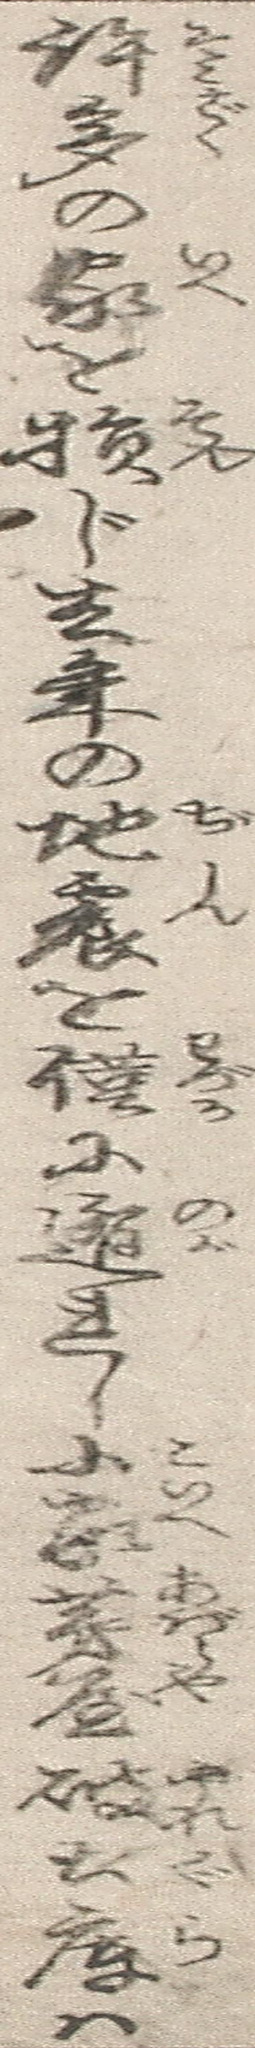許多の家を損じ去年の地震を僅に遁れし小家茅屋破土庫ハ
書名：安政風聞集　上中下　全
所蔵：東京大学地震研究所図書室 Earthquake Research Institute Library, The University of Tokyo, JAPAN
